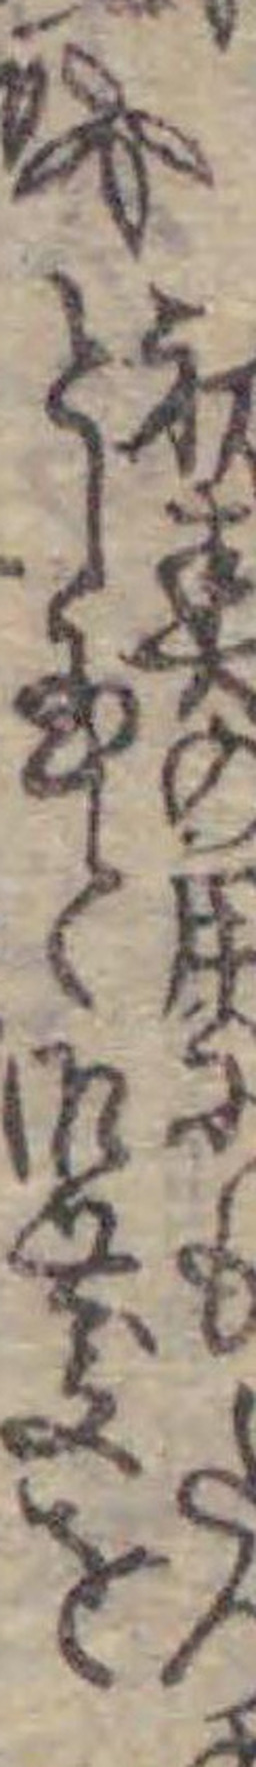とし玉と御慶を
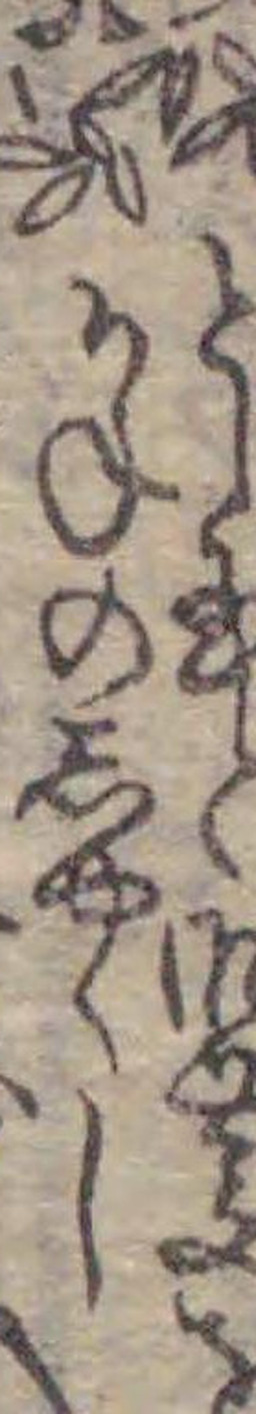かねのしやくし
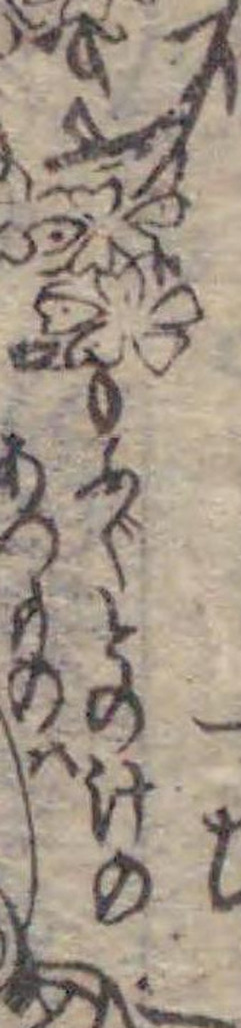ふぐとの汁の
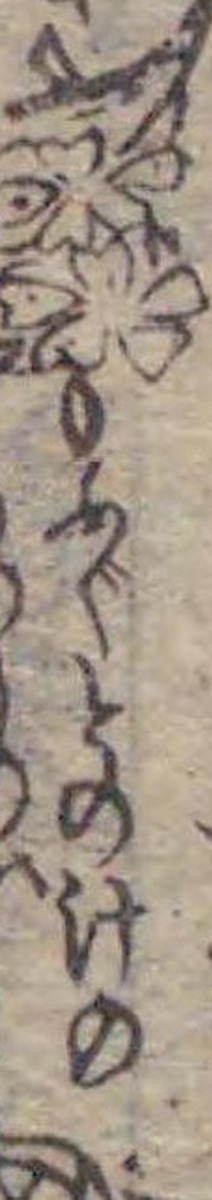ふぐとの汁の
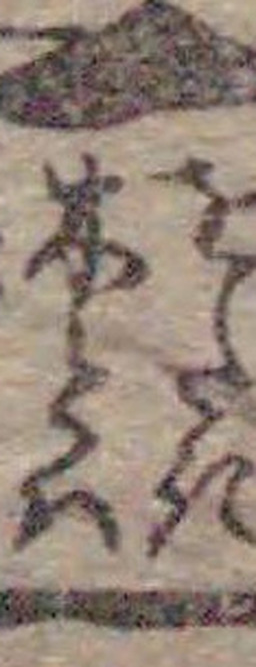木とは
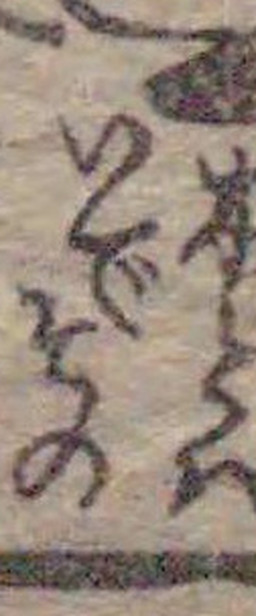いでその
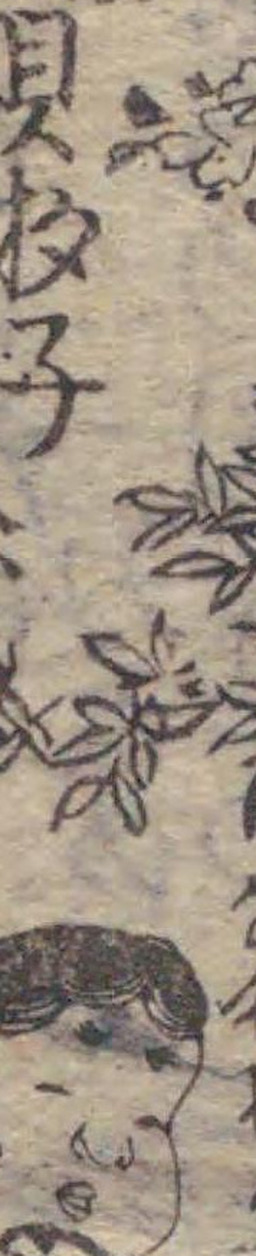貝杓子
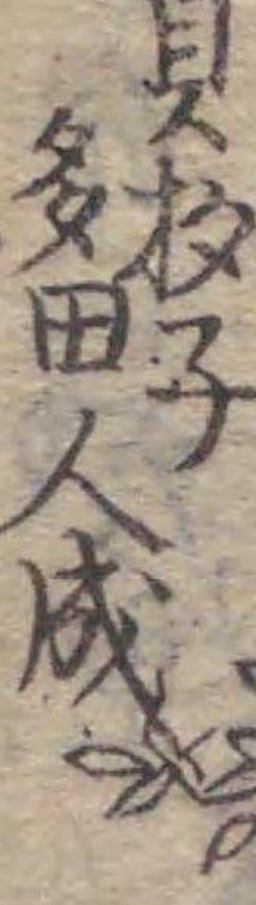多田人成
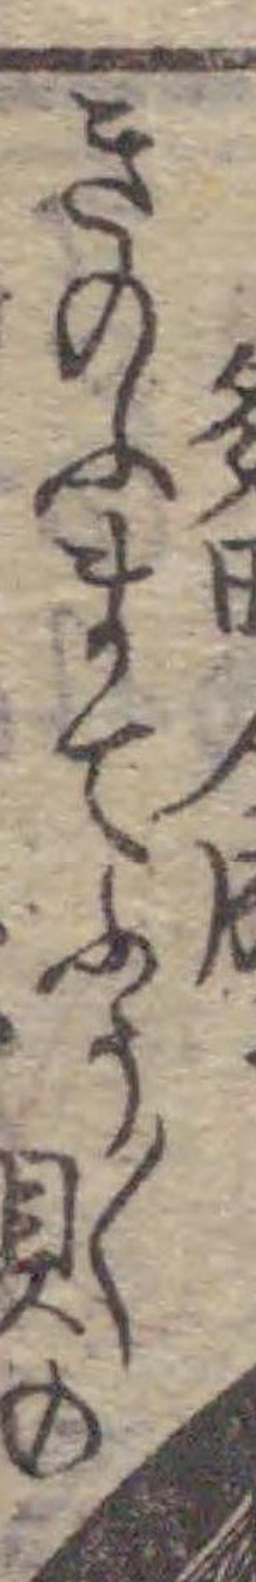きのふまてふう〳〵
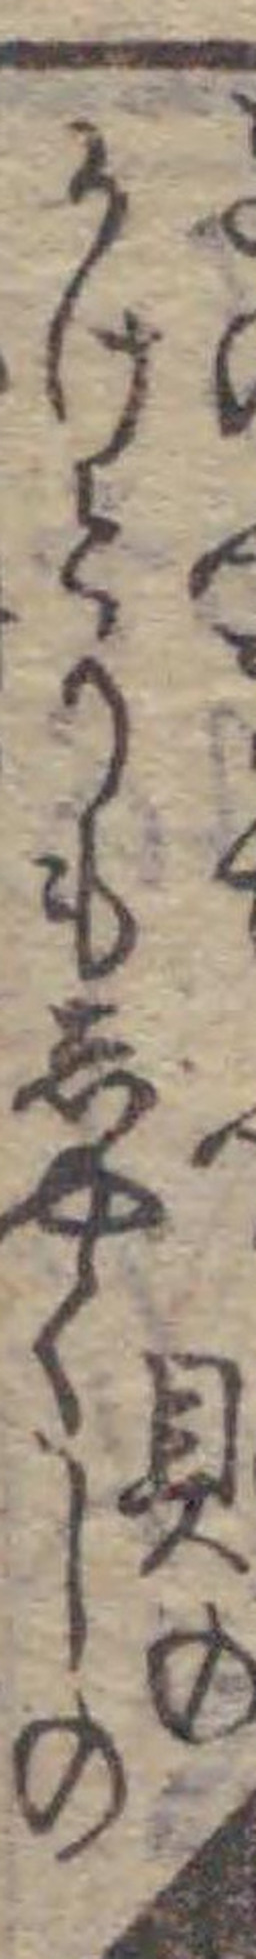かけとりもしやくしの
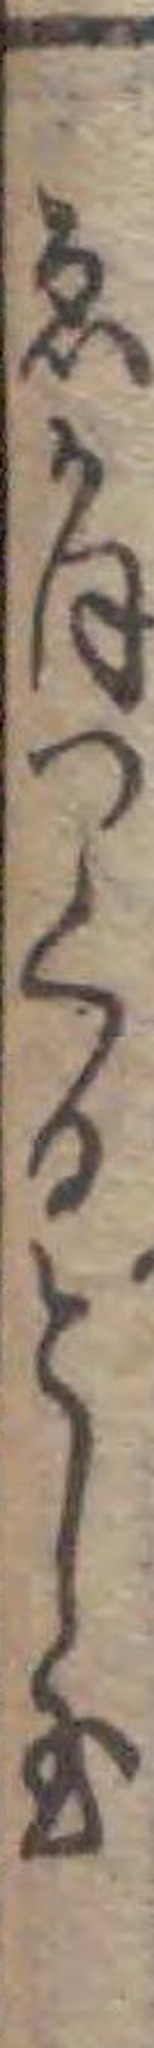ゑかほつくるとし玉
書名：年始御礼帳 : 3巻
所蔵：国立国会図書館 National Diet Library, JAPAN
